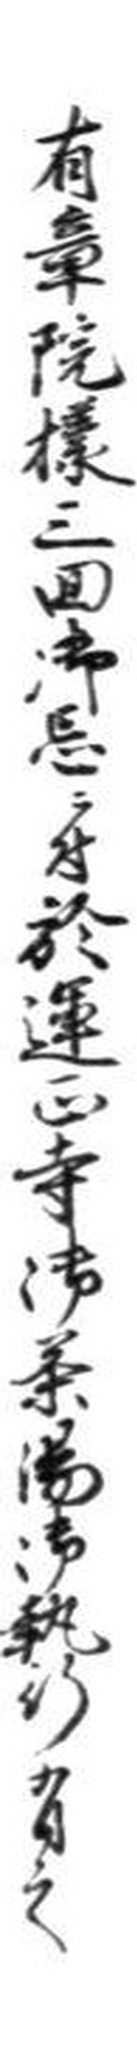有章院様三回御忌ニ付於運正寺御茶湯御執行有之
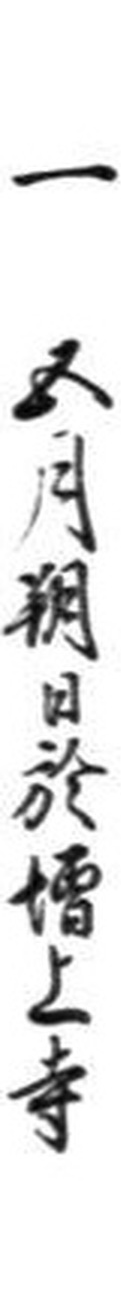一五月朔日於増上寺
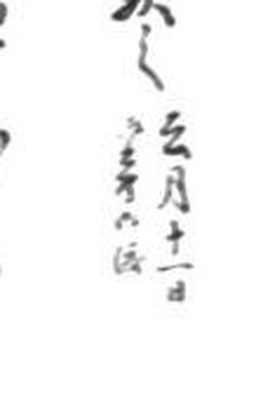御書付御渡
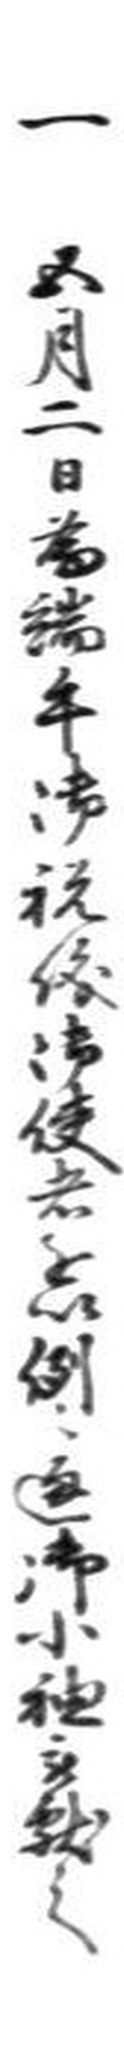一五月二日為端午御祝儀御使者を以例之通御小袖被献之
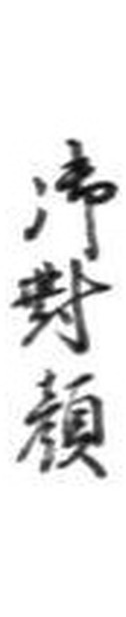御対顔
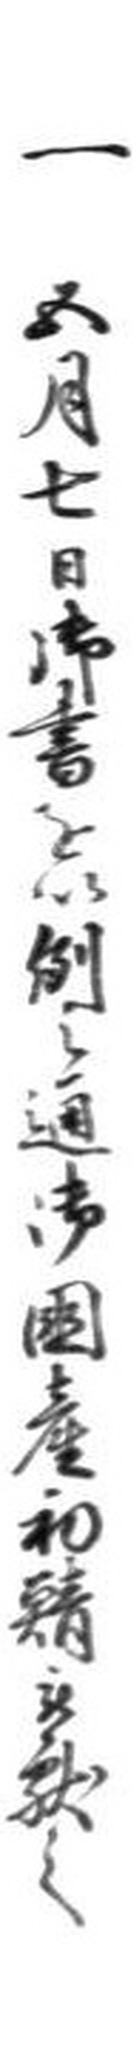一五月七日御書を以例之通御国産初鯖被献之
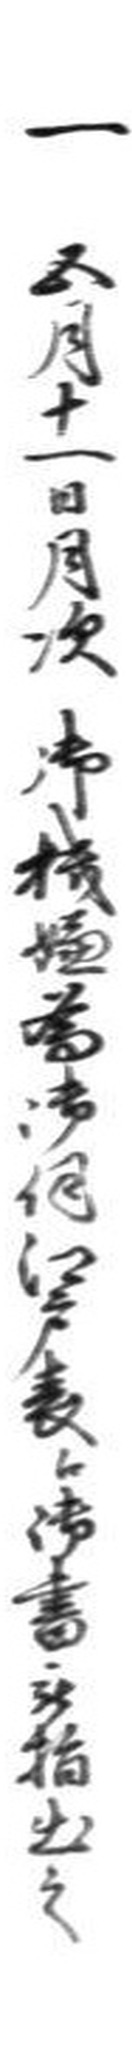一五月十一日月次御機嫌為御伺江戸表江御書被指出之
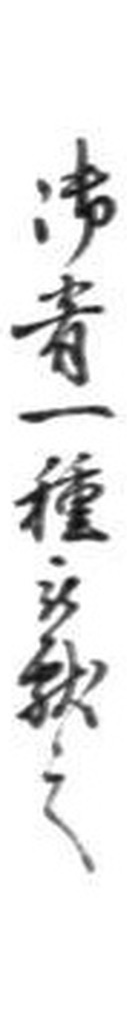御肴一種被献之

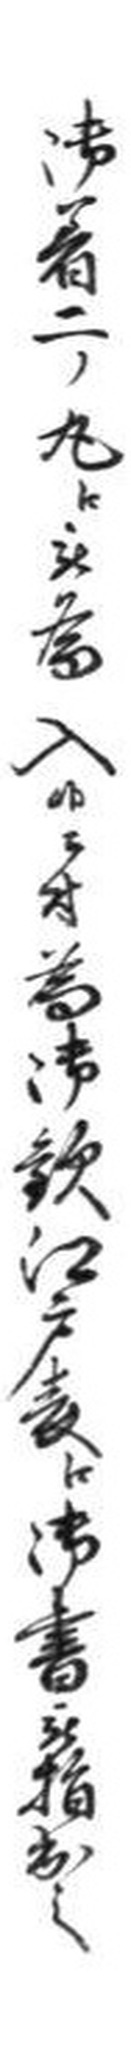御着二ノ丸江被為入候ニ付為御歓江戸表江御書被指出之
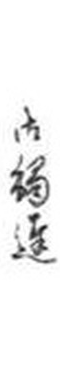御触達
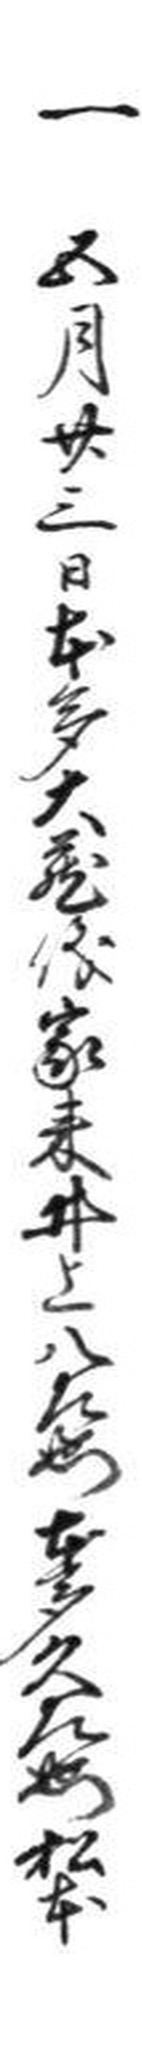一五月廿三日本多大蔵儀家来井上八左衛門本多久左衛門松本
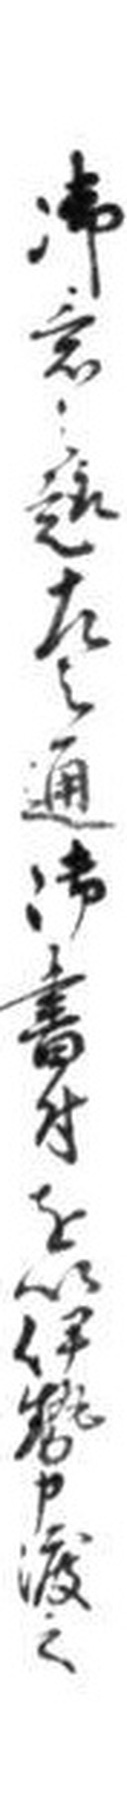申達之御意之趣左之通御書付を以伊勢申渡之
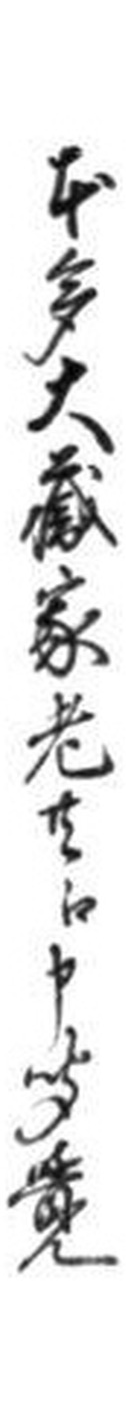本多大蔵家老共江申聞覚
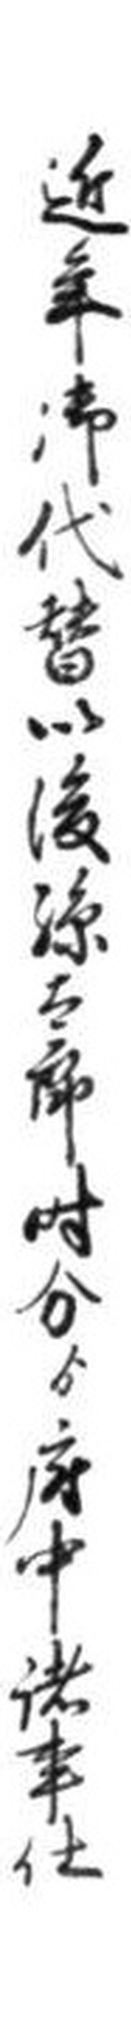近年御代替以後孫太郎時分ゟ府中諸事仕
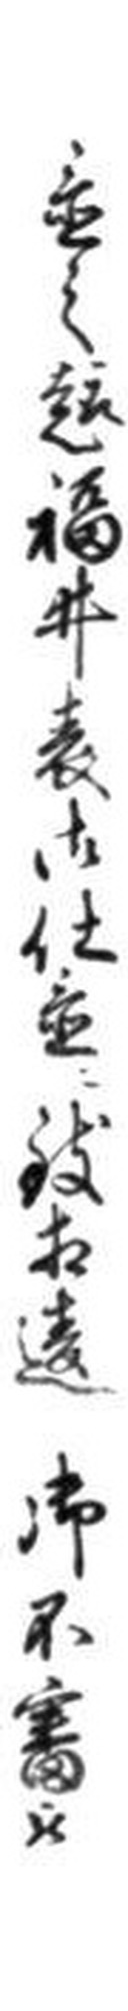置之趣福井表御仕置ニ致相違御不審被
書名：家譜 三十二 吉邦公 従享保二年到享保三年
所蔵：福井県文書館 Fukui Prefectural Archives
